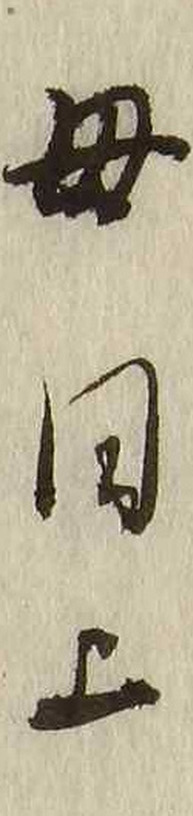母同上
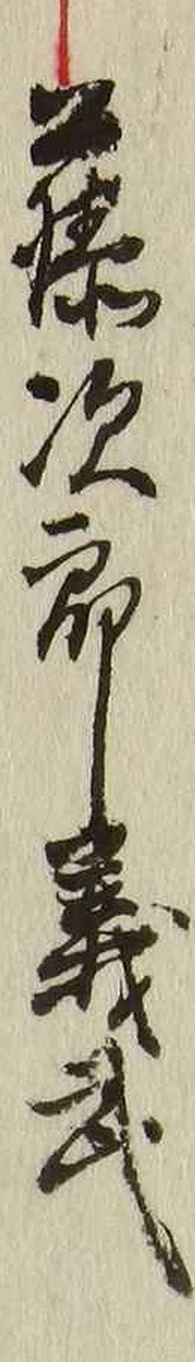藤次郎義武
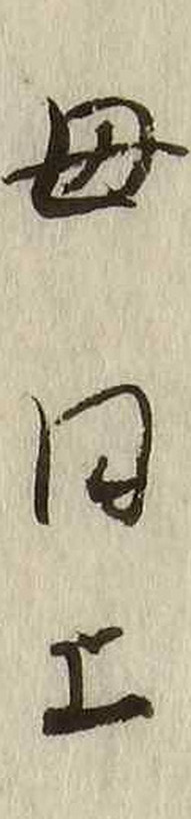母同上
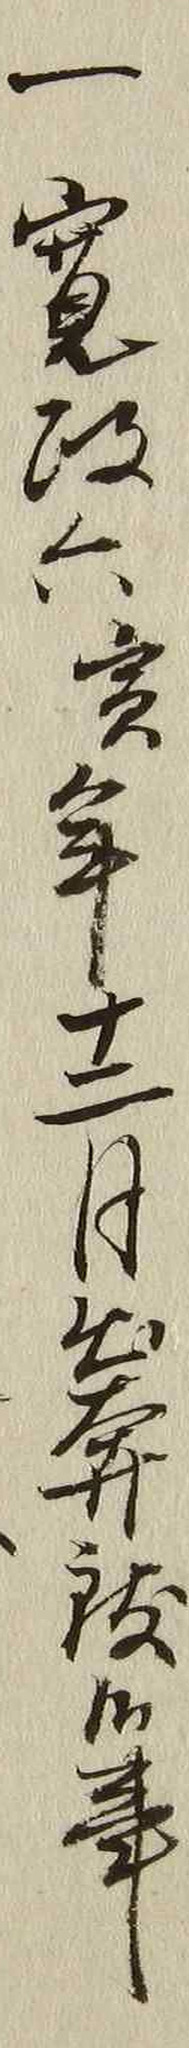一寛改六寅年十二月出奔致候事
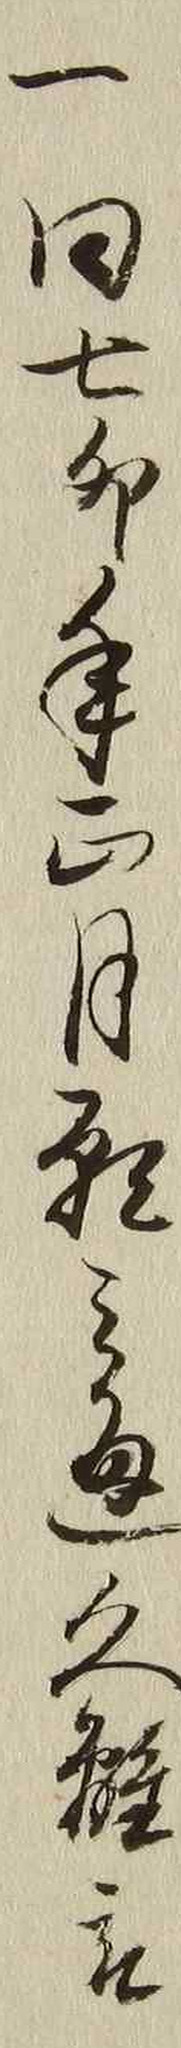一同七卯年正月願之通久離被
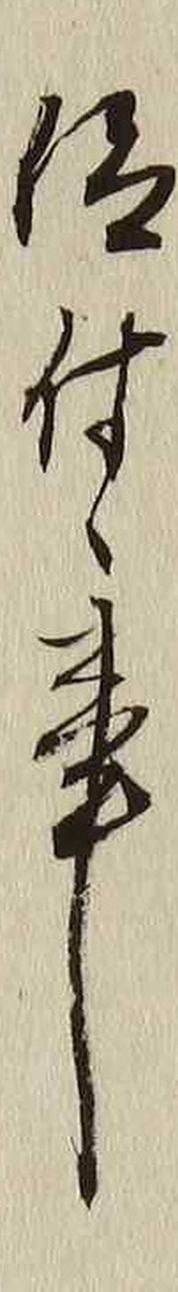仰付候事
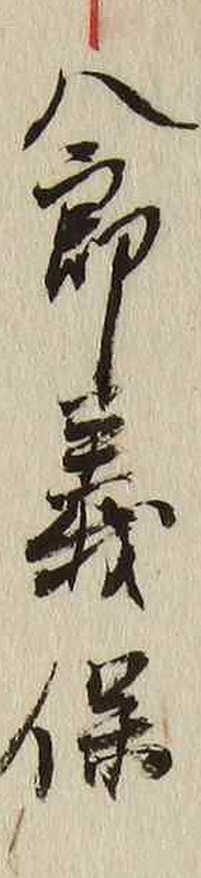八郎義保
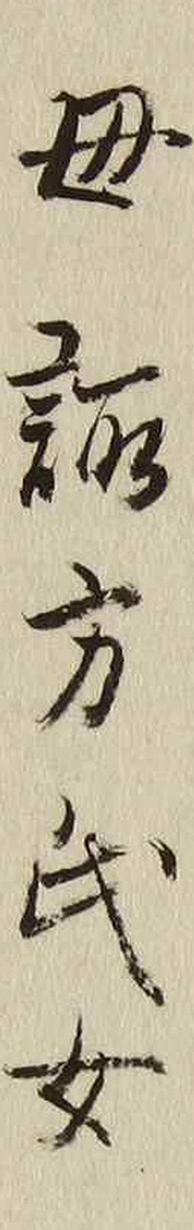母諏方氏女
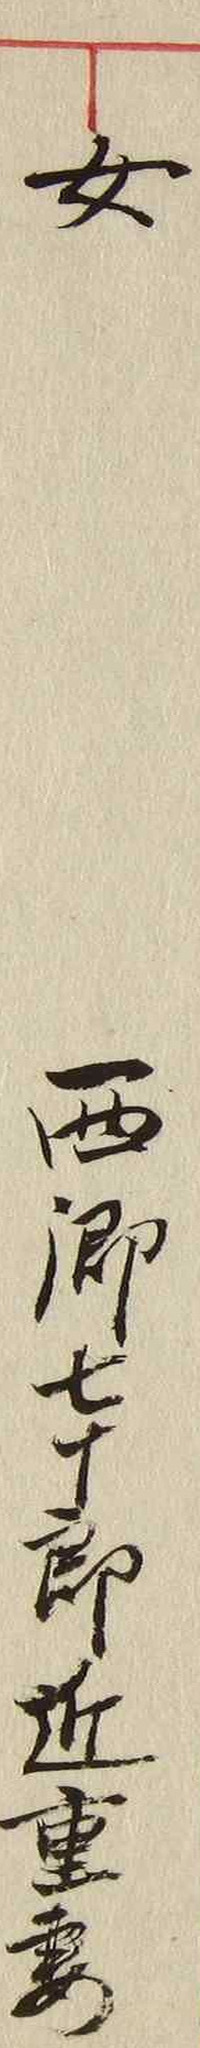女西郷七十郎近重妻
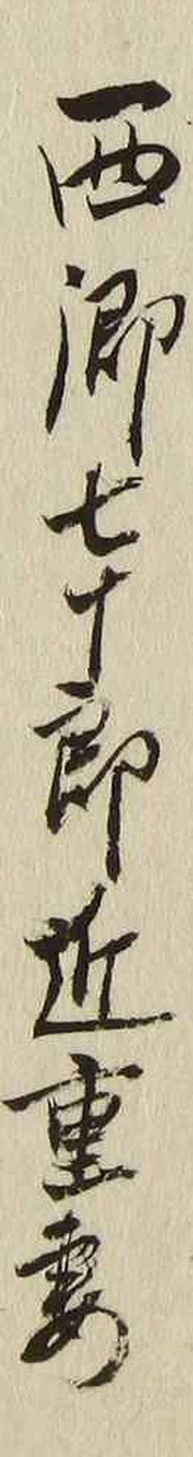女西郷七十郎近重妻
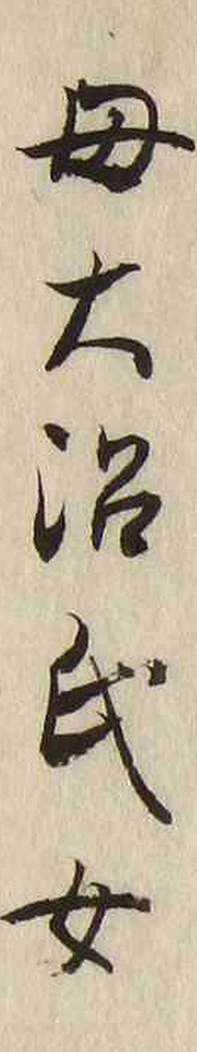母大沼氏女

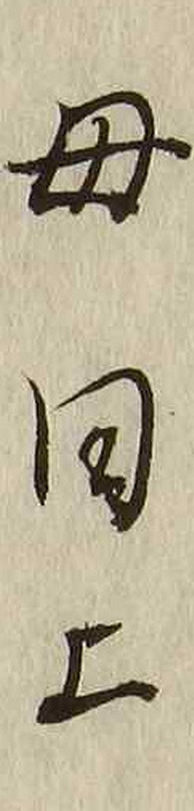母同上
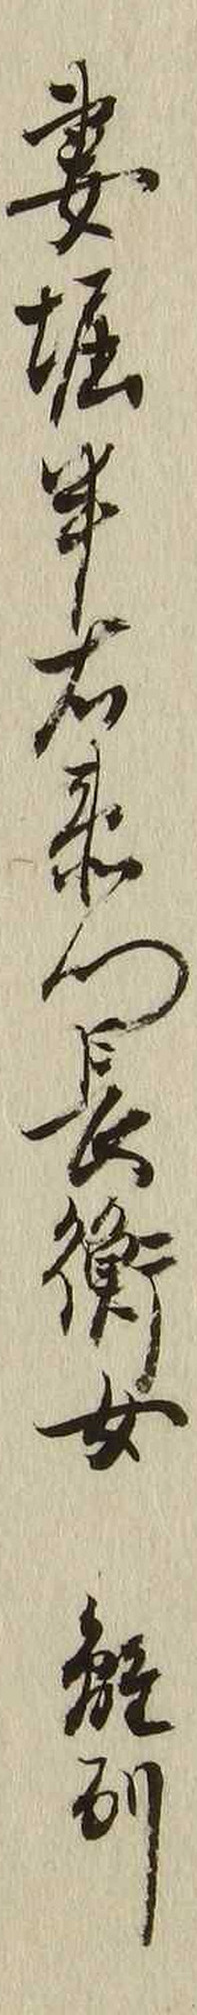妻堀半右衛門長衛女離別
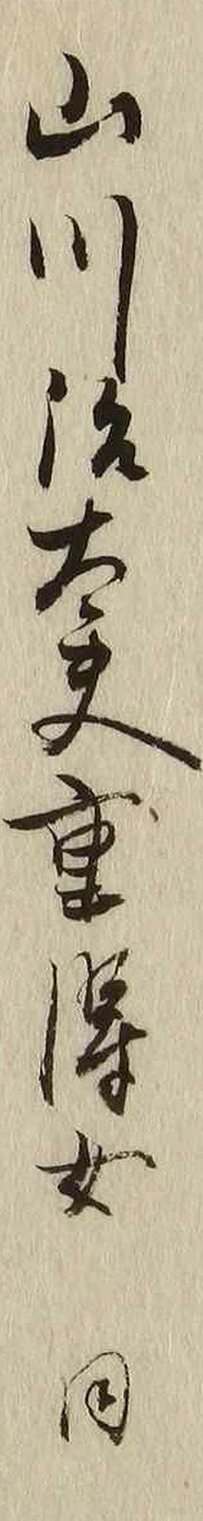山川治太夫重得女同
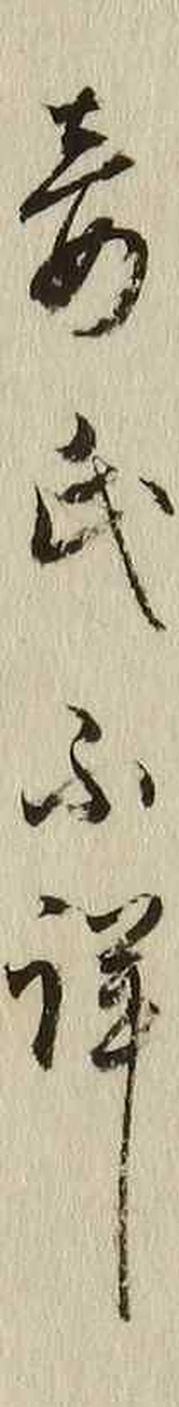妾氏不詳
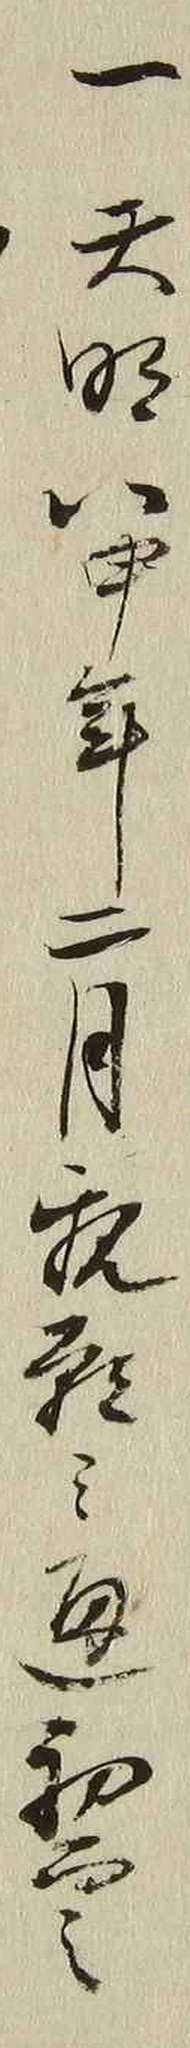一天明八申年二月親願之通初而之
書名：諸士系譜　巻之348　も之部4
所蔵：会津若松市立会津図書館
